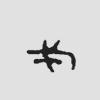弋
